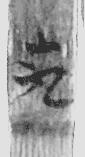{十九}
